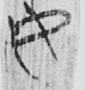女（如）
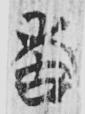○（故）
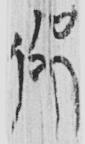伽（加）
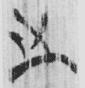之
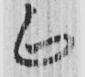㠯（以）
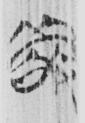敬
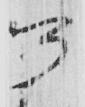乃
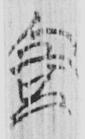命
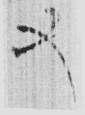又（有）
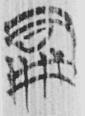○（司）
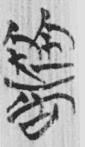箸
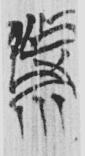○（祚）
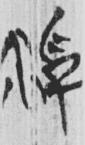浮
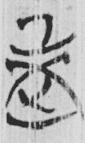老
